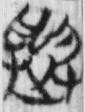○（舉）
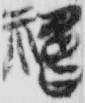禱
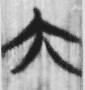大
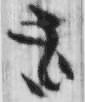水
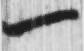一
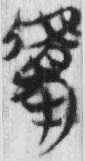膚
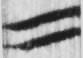二
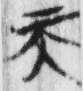天
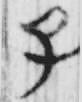子
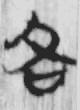各
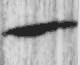一
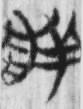牂
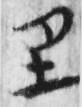坐
